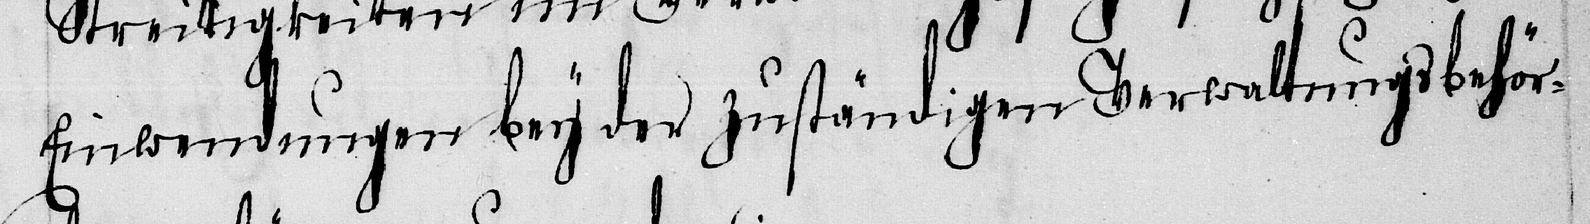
Einwendungen bey der zuständigen Verwaltungsbehör¬
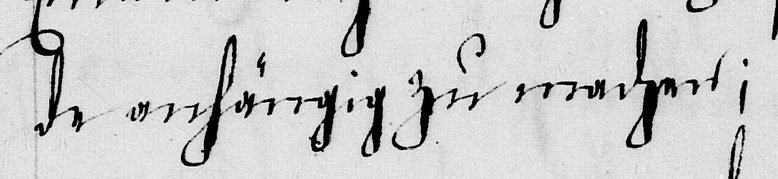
de anhängig zu machen;
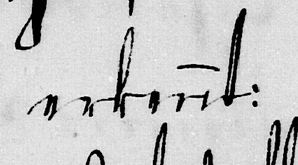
erkennt:
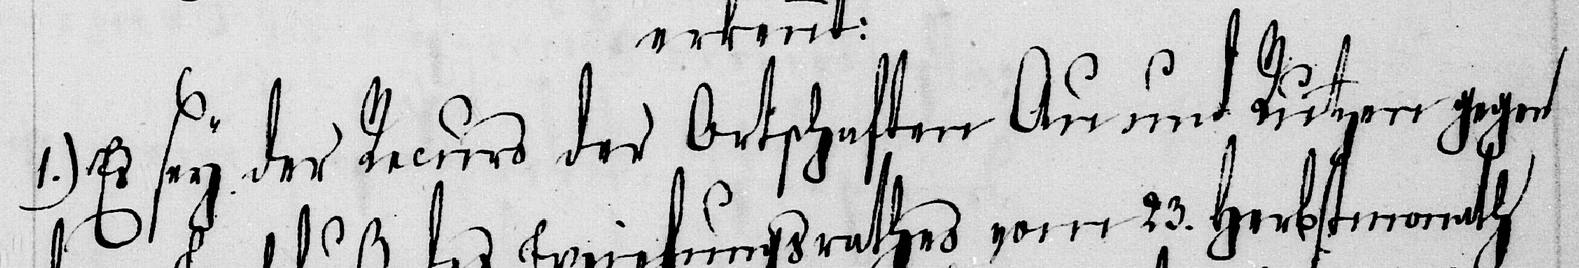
Es sey der Recurs der Ortschaften Au und Rutzen gegen
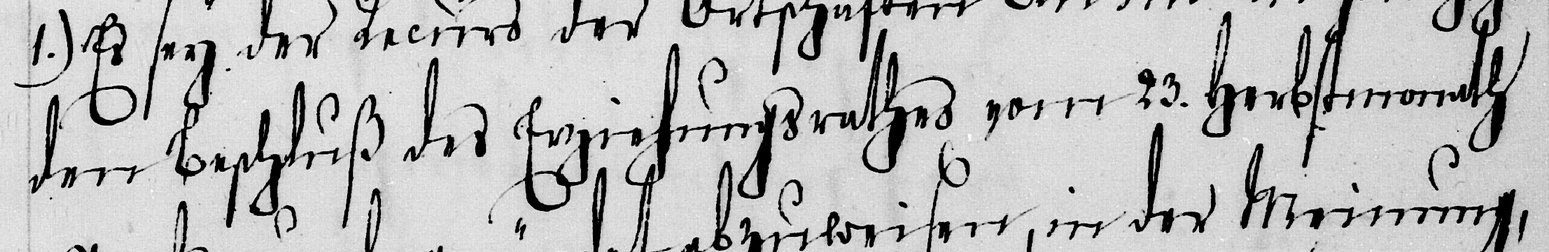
den Beschluß des Erziehungsrathes vom 23. Herbstmonath
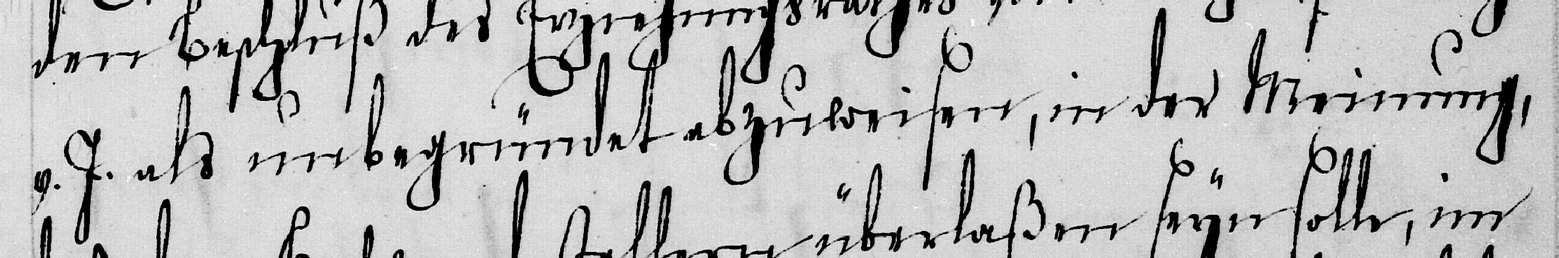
v. J. als unbegründet abzuweisen, in der Meinung,
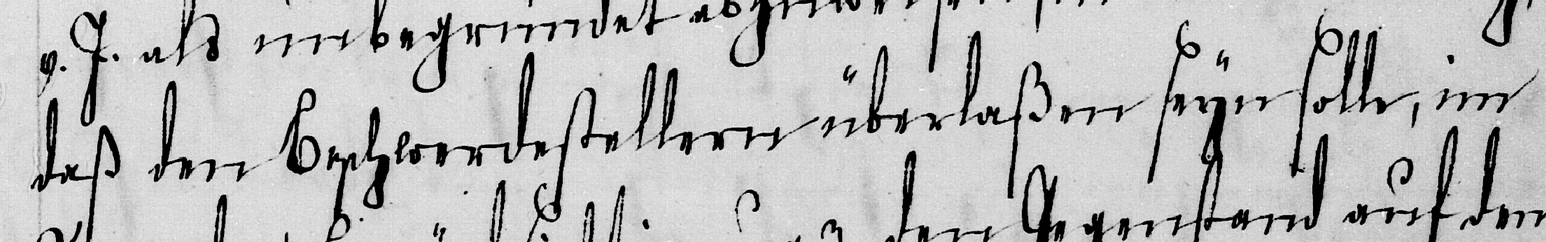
daß den Beschwerdestellern überlaßen seyn solle, im
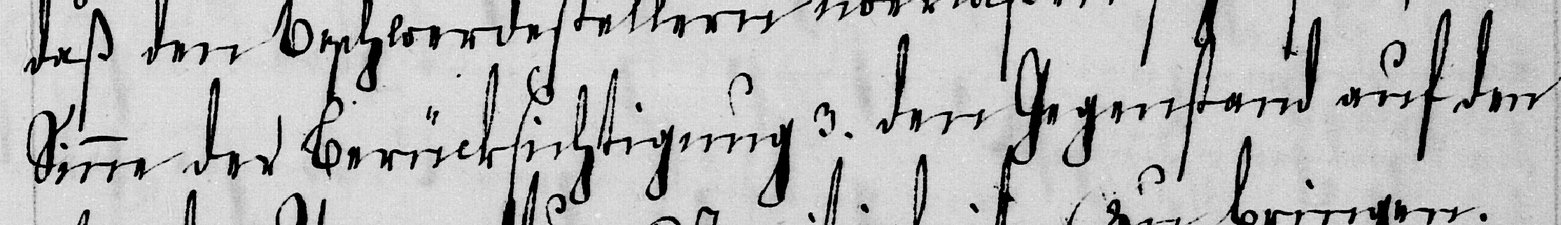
Sinn der Berücksichtigung 3. den Gegenstand auf den
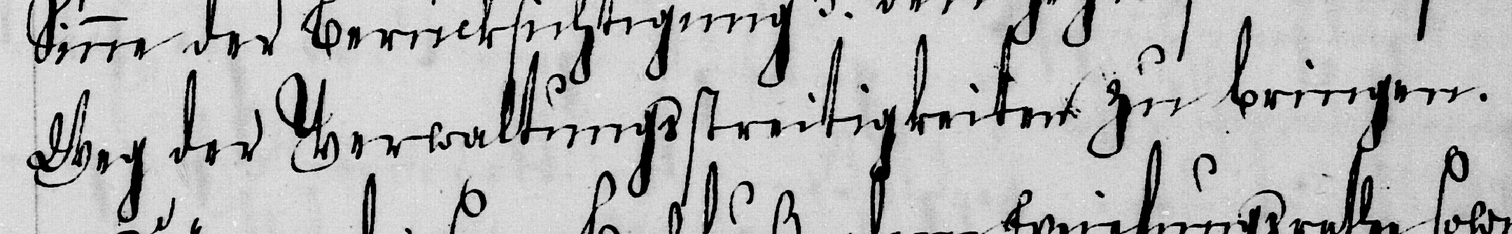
Weg der Verwaltungsstreitigkeiten zu bringen.
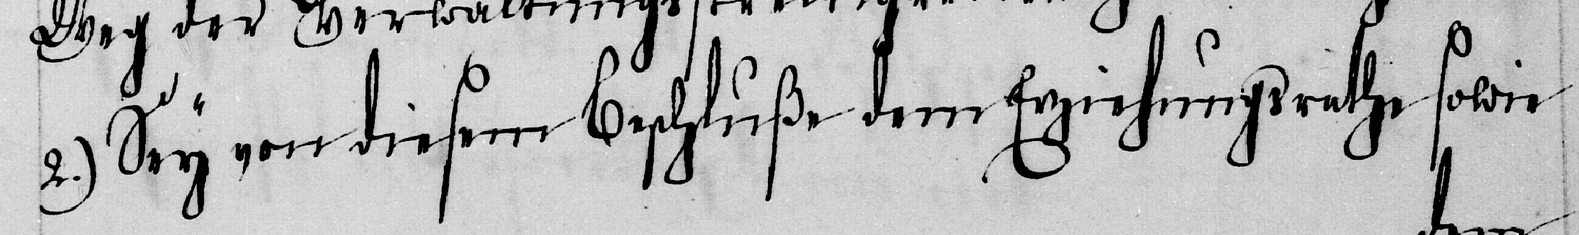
2.) Sey von diesem Beschluße dem Erziehungsrathe sowie
